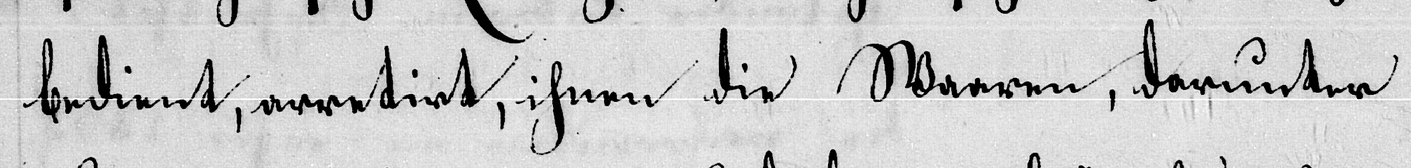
bedient, arretirt, ihnen die Waaren, darunter
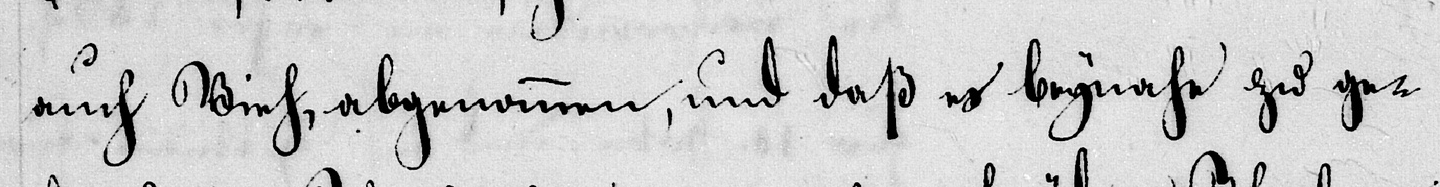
auch Vieh, abgenommen, und daß es beynahe zu ge¬
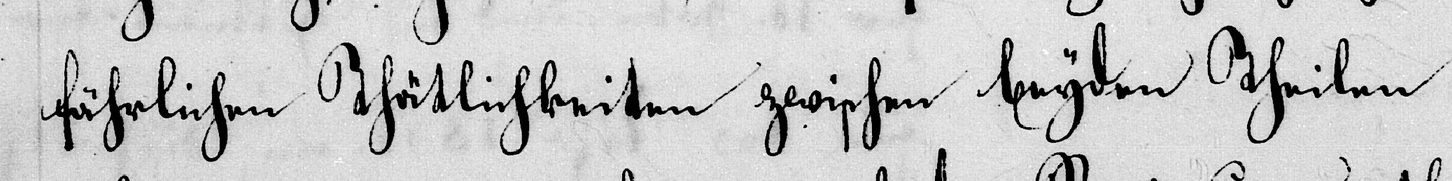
fährlichen Thätlichkeiten zwischen beyden Theilen
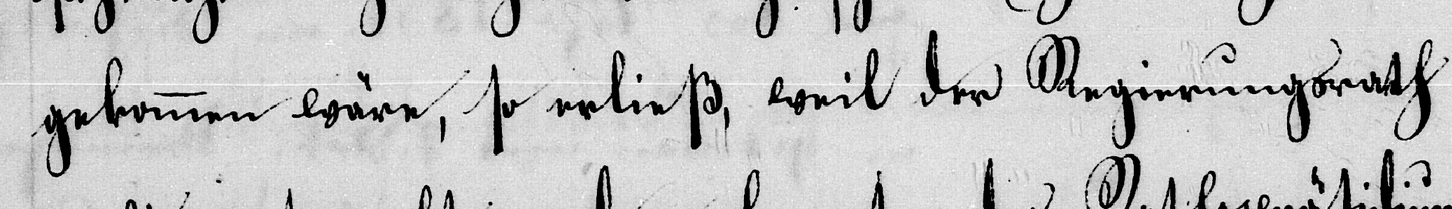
gekommen wäre, so erließ, weil der Regierungsrath
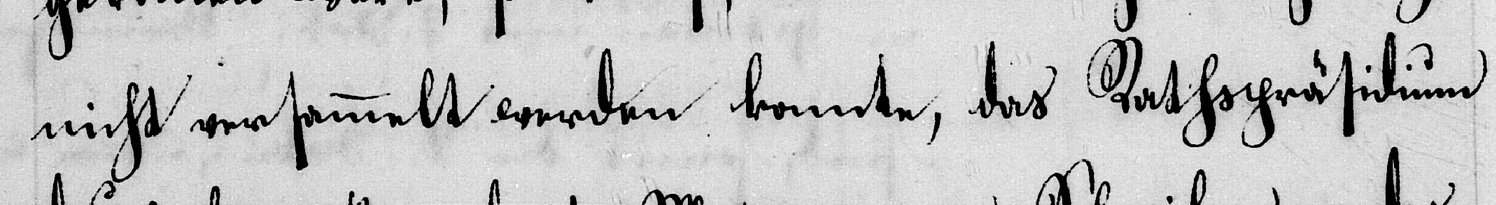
nicht versammelt werden konnte, das Rathspräsidium
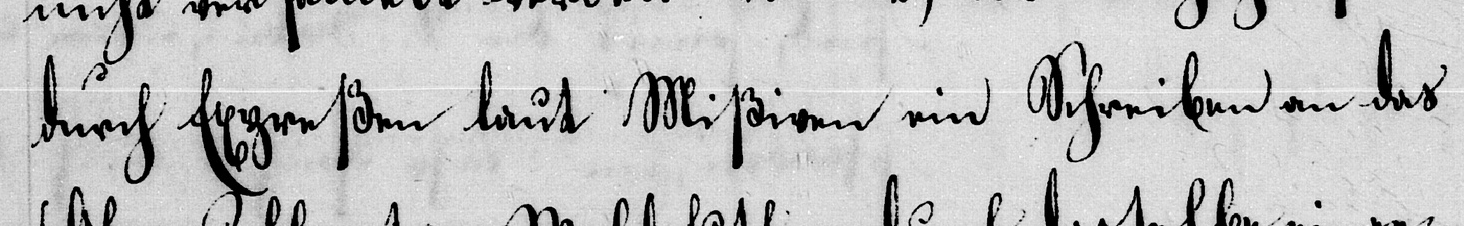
durch Expreßen laut Mißiven ein Schreiben an das
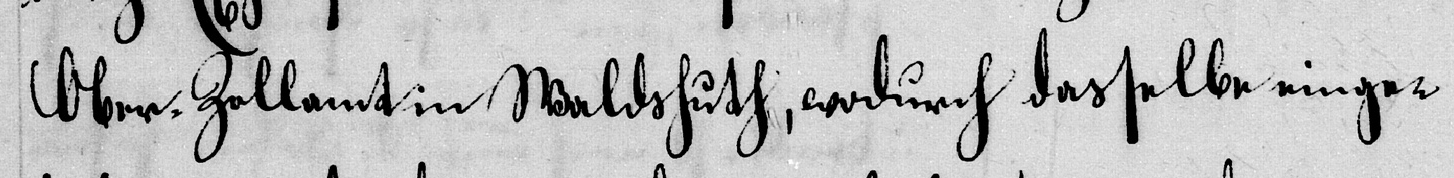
Ober-Zollamt in Waldshuth, wodurch dasselbe einge¬
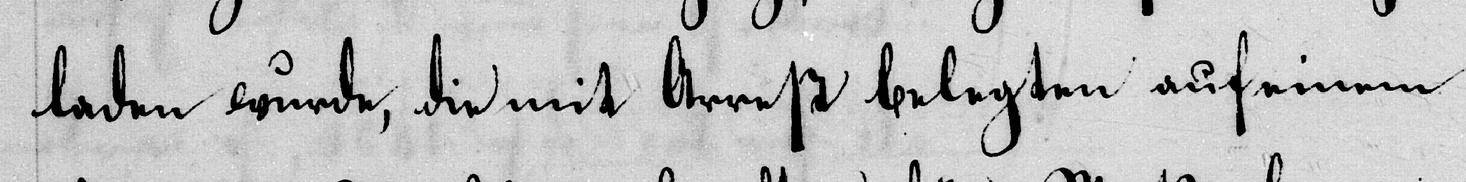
laden wurde, die mit Arrest belegten auf einem
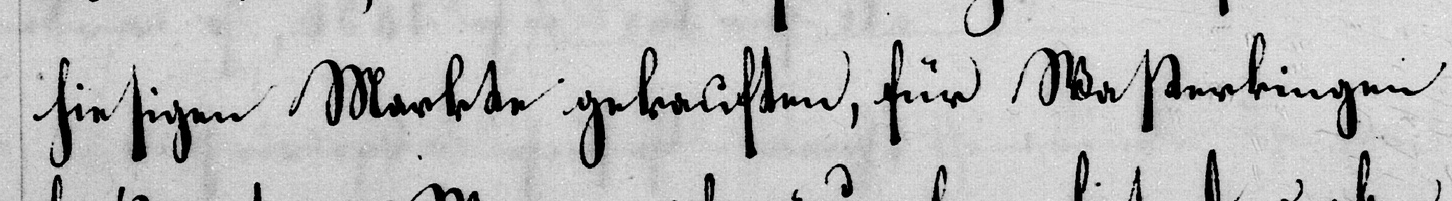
hiesigen Markte gekauften, für Wasterkingen
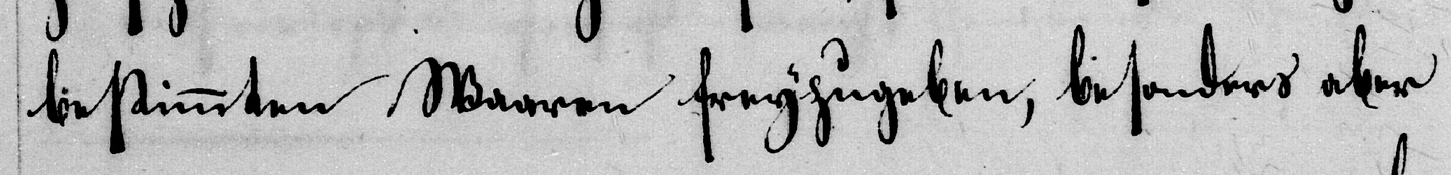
bestimmten Waaren freyzugeben, besonders aber
